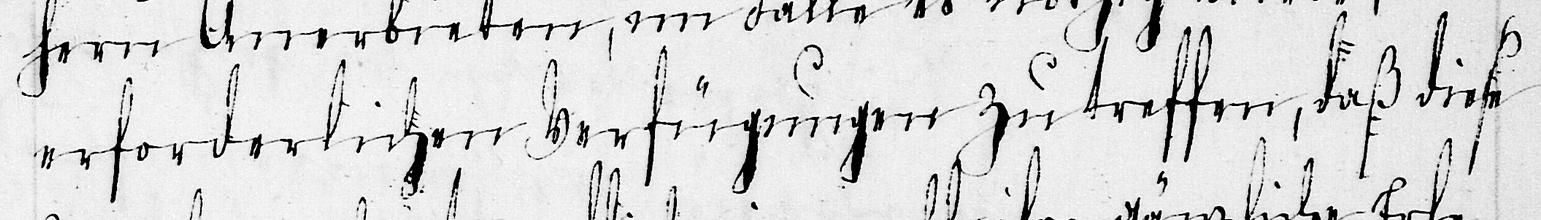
erforderlichen Verfügungen zu treffen, daß diese
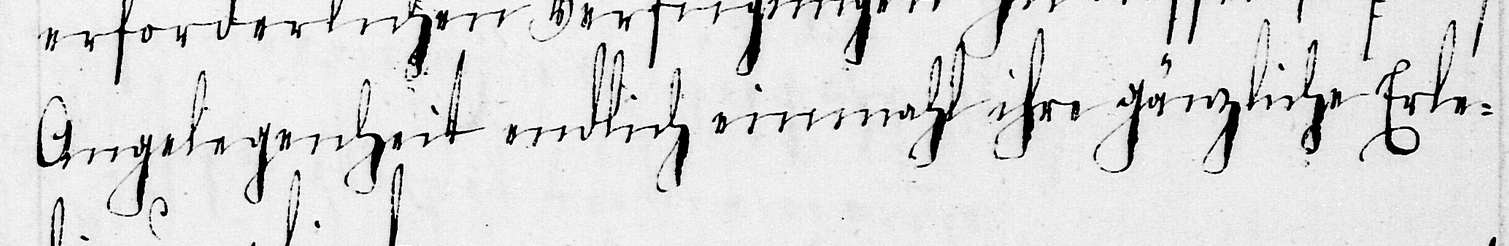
Angelegenheit endlich einmahl ihre gänzliche Erle¬
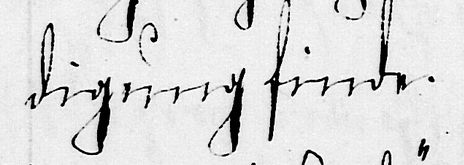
digung finde.
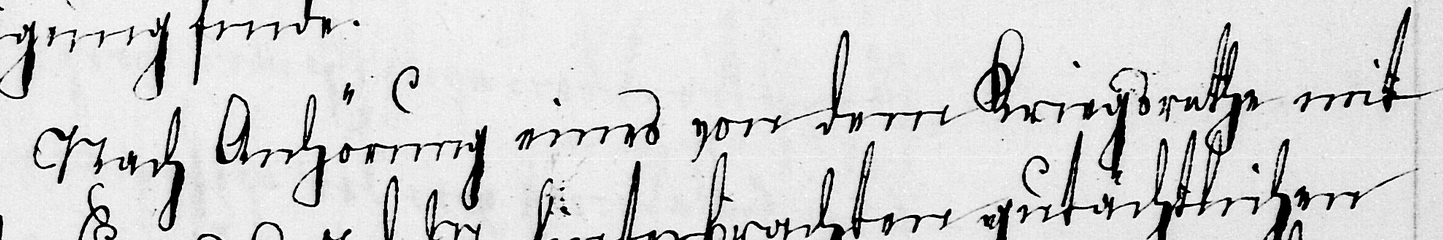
Nach Anhörung eines von dem Kriegsrathe mit
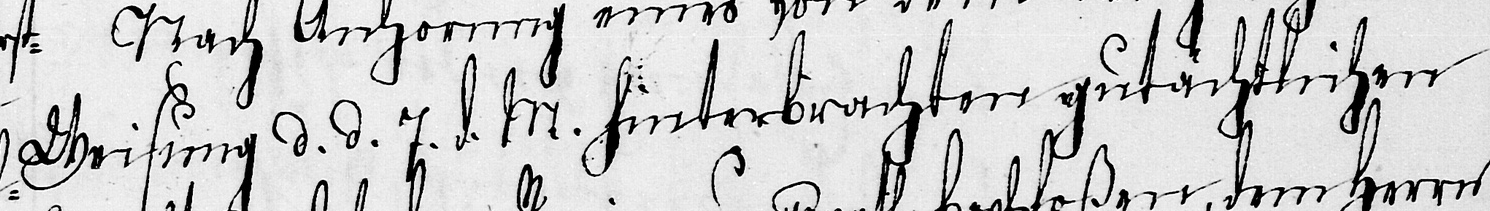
Weisung d. d. 7. d. M. hinterbrachten gutächtlichen
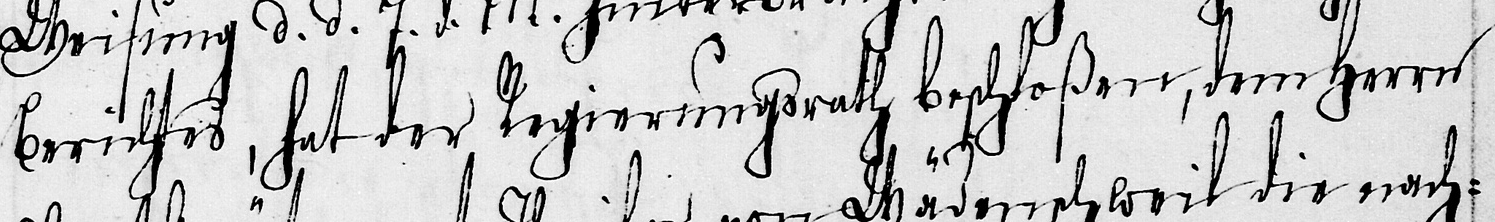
Berichtes, hat der Regierungsrath beschloßen, dem Herrn
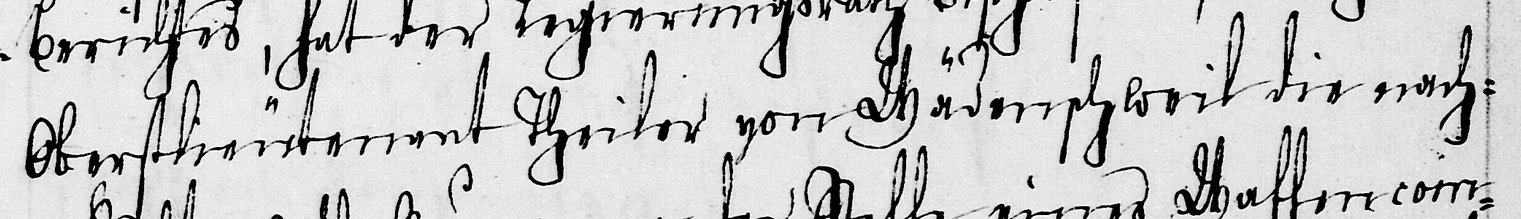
Oberstlieutenant Theiler von Wädenschweil die nach¬
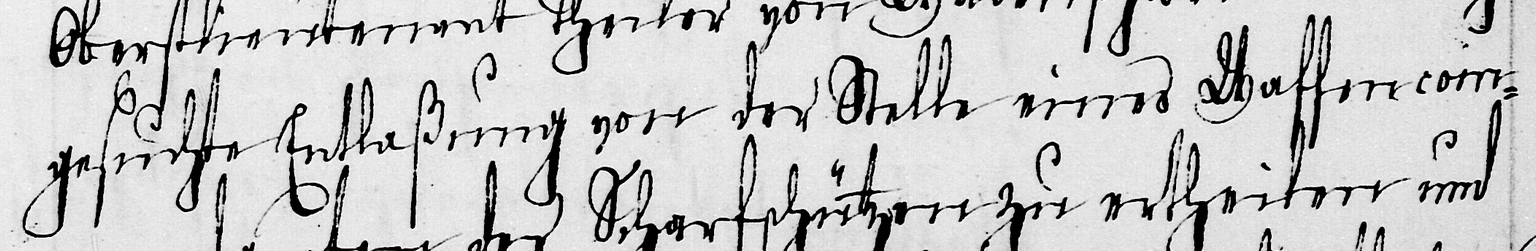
gesuchte Entlaßung von der Stelle eines Waffencom¬
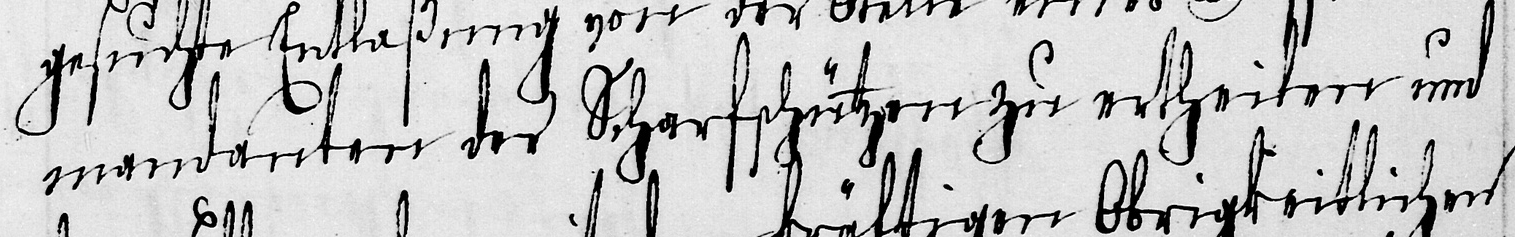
mandanten der Scharfschützen zu ertheilen und
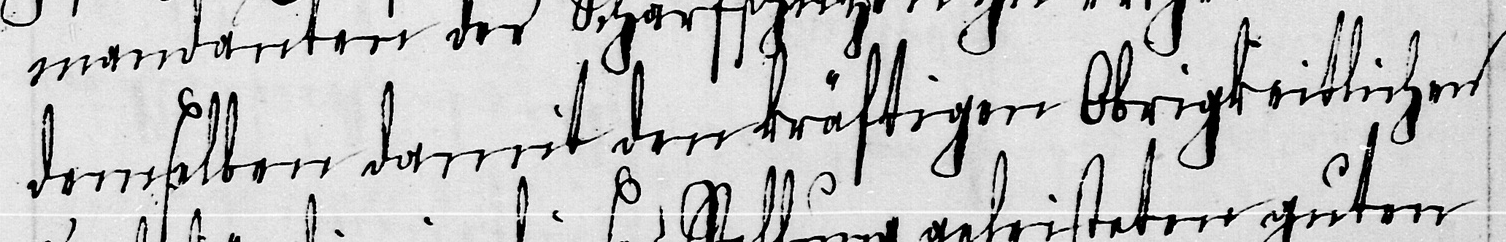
demselben damit den kräftigen Obrigkeitlichen
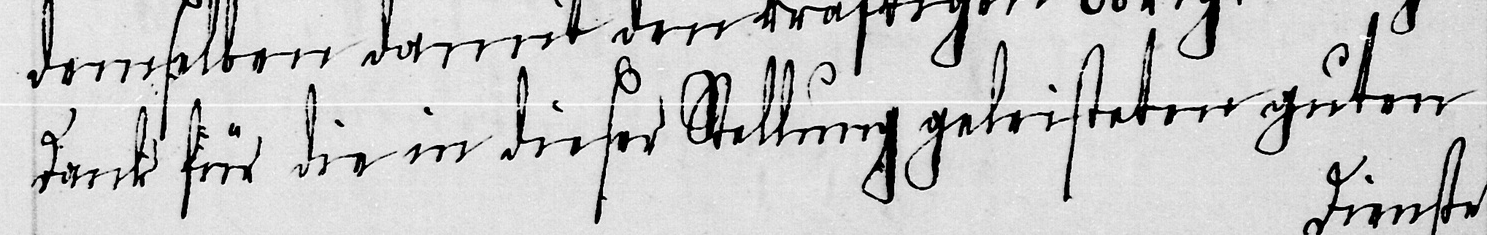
Dank für die in dieser Stellung geleisteten guten
